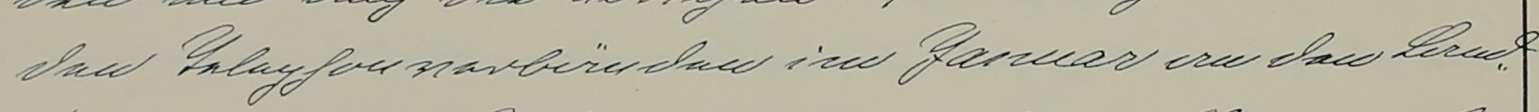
den Telephonverbänden im Januar an den Land-
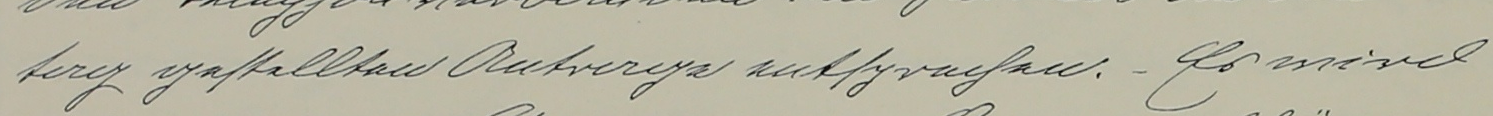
tag gestellten Antrage entsprechen. – Es wird
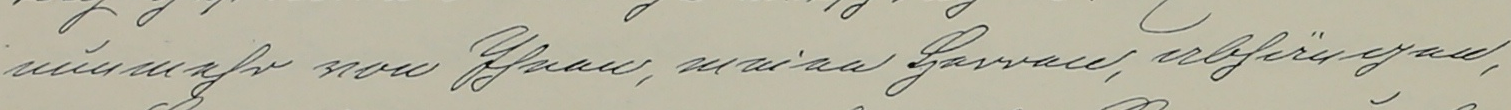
nunmehr von Ihnen, meine Herren, abhängen,
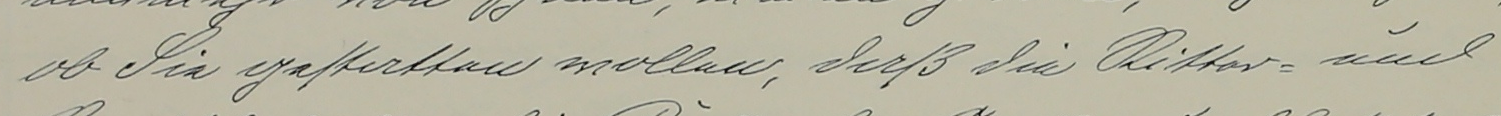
ob Sie gestatten wollen, daß die Ritter- und
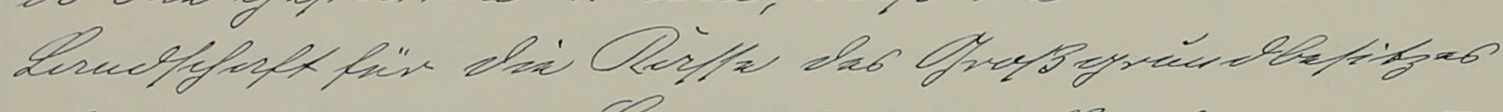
Landschaft für die Kasse des Großgrundbesitzes
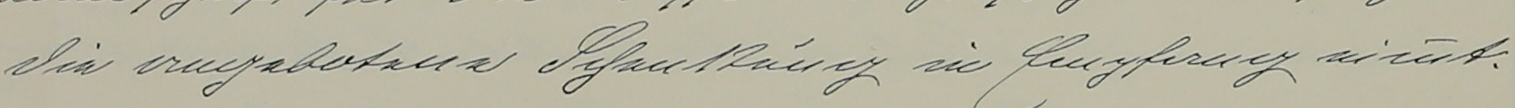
die angebotene Schenkung in Empfang nimmt.
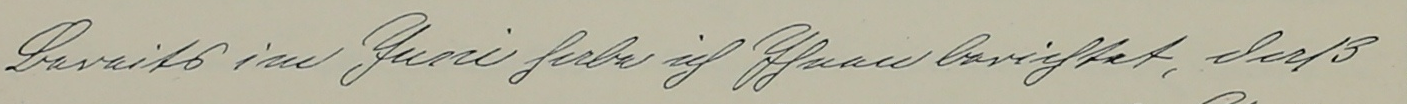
Bereits im Juni habe ich Ihnen berichtet, daß
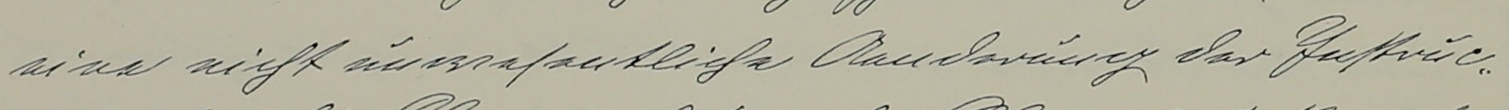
eine nicht unwesentliche Aenderung der Instruc-
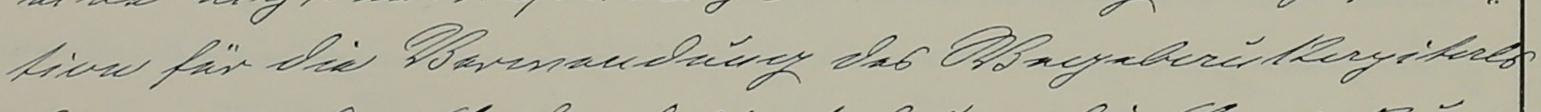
tion für die Verwendung des Wegebaukapitals
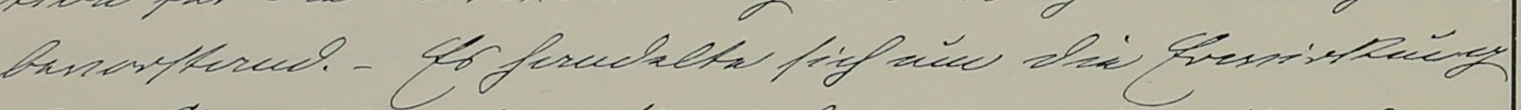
bevorstand. - Es handelte sich um die Erwirkung
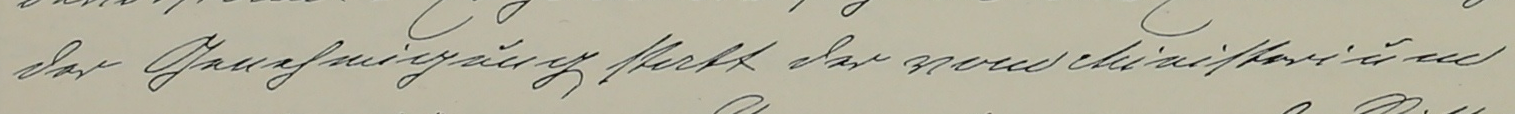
der Genehmigung, statt der vom Ministerium
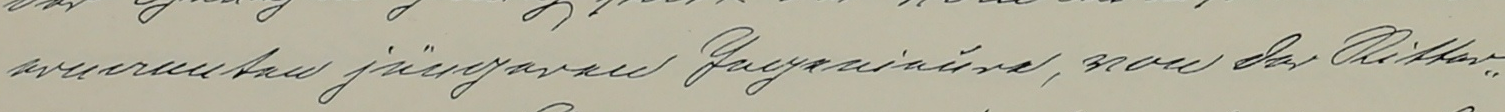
ernannten jüngeren Ingenieure, von der Ritter-
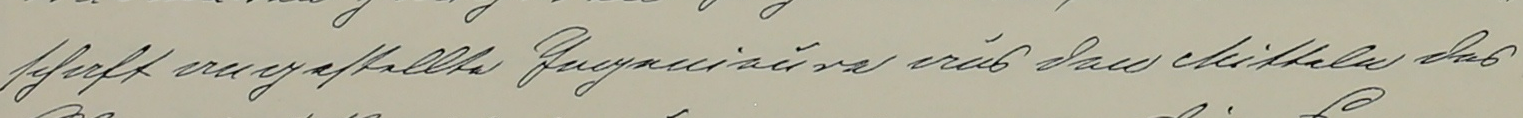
schaft angestellte Ingenieure aus den Mitteln des
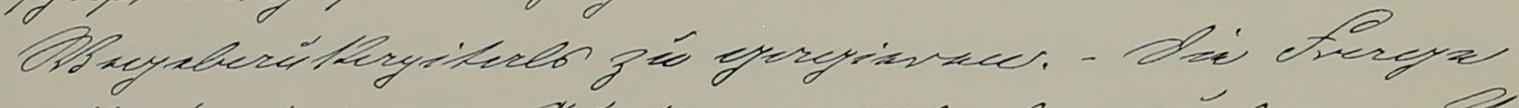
Wegebaukapitals zu gagieren. - Die Frage
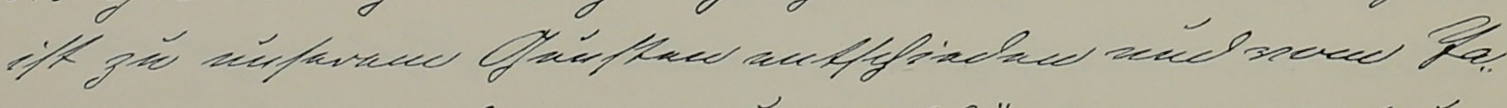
ist zu unseren Gunsten entschieden und vom Ja-
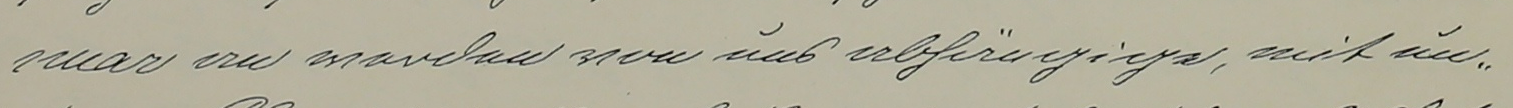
nuar an werden von uns abhängige, mit un-
